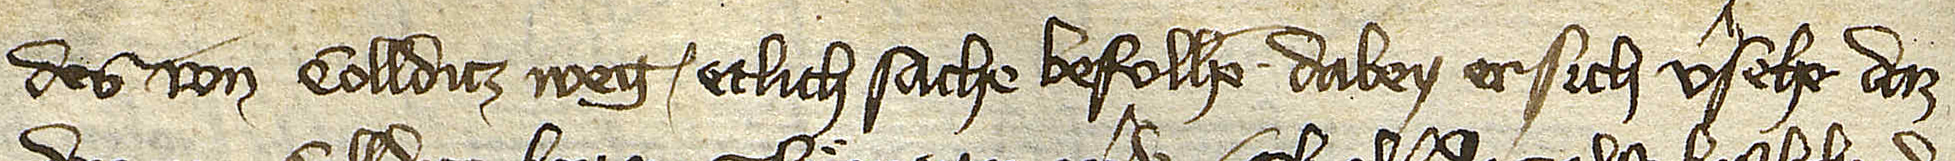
des von Colldicʒ weg* etlich ſache befolhe* . dabey er ſich v*ſehe daʒ
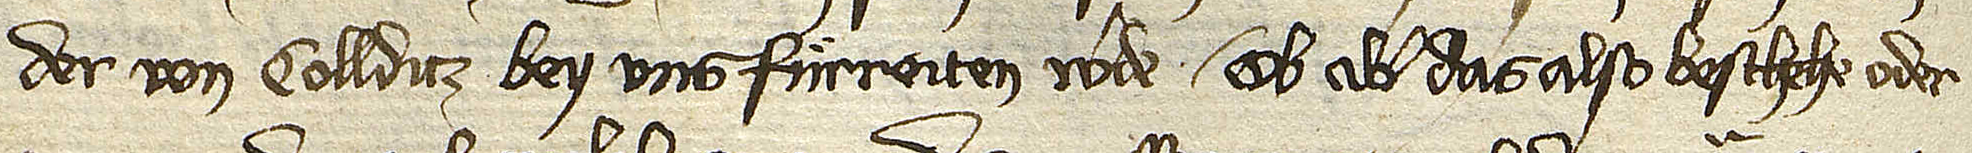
der von Colldicʒ bey vns fürreiten w*de . / Ob ab* das alſo beſchehe oder
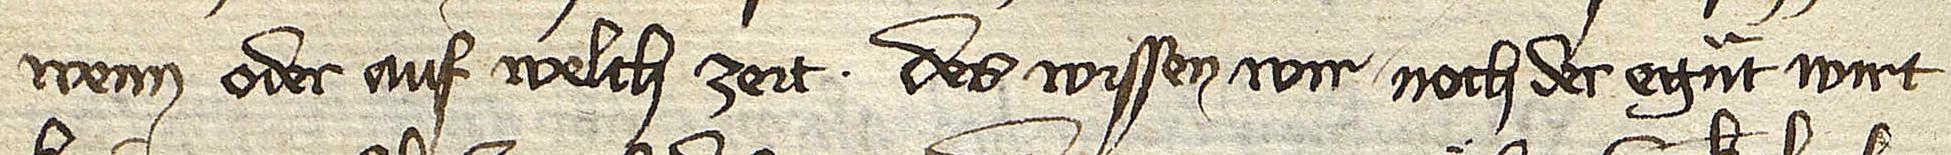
wenn oder auf welch ʒeit . Des wiſſen wir noch der egnt* wirt
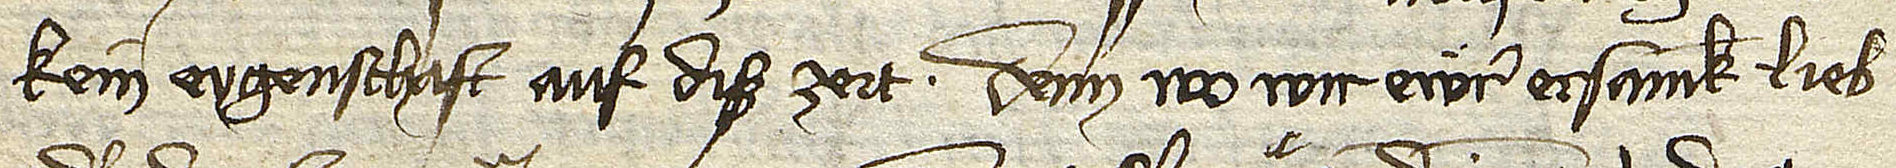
kein eygenſchaft auf diſʒ ʒeit . Denn wo wir ew*r erſamk* lieb
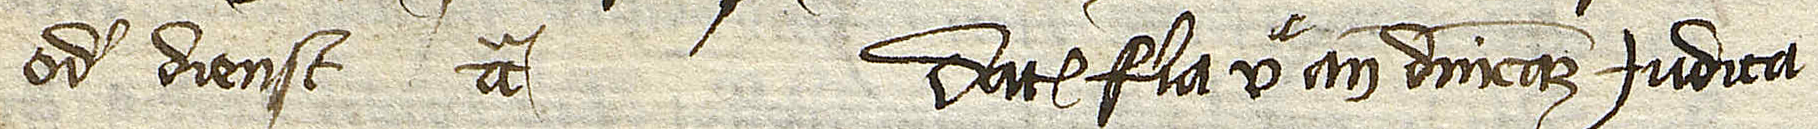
od* dienſt ec* Dat* fia v* an* dnica* Iudica
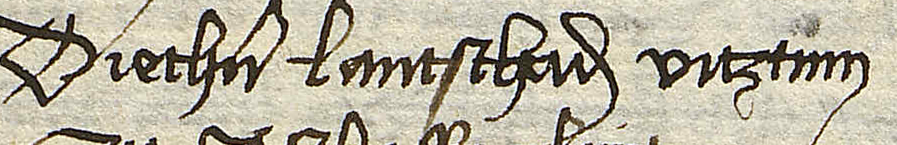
Dieth*n lantſchad* vicʒtum
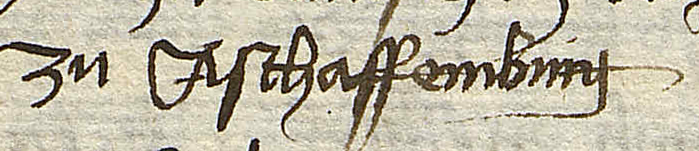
ʒu Aſchaffemburg
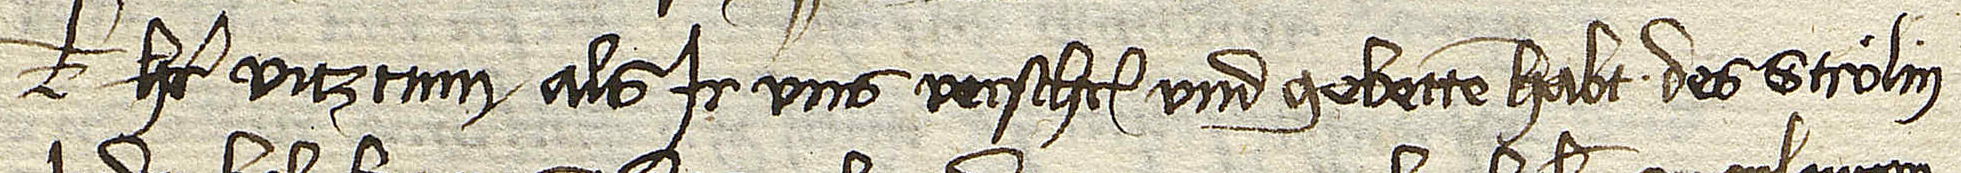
L* h*r vicʒtum / als Ir vns verſchr* vnd gebette* habt . des Strölin
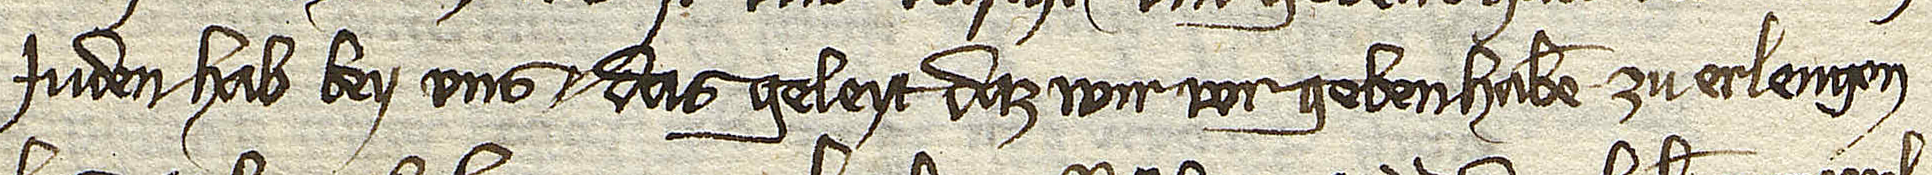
Iuden hab bey vns / das geleyt daʒ wir vor geben habe* ʒu erlengen
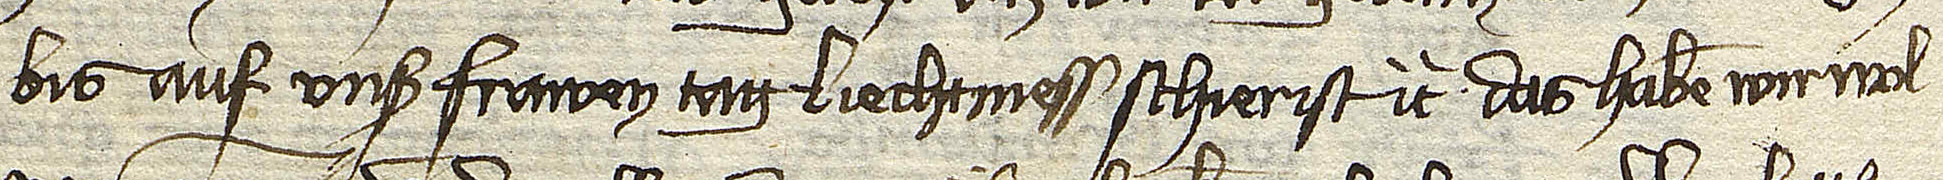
bis auf vnſ* frawen tag liechtmeſſ ſchieriſt ec* . das habe* wir wol
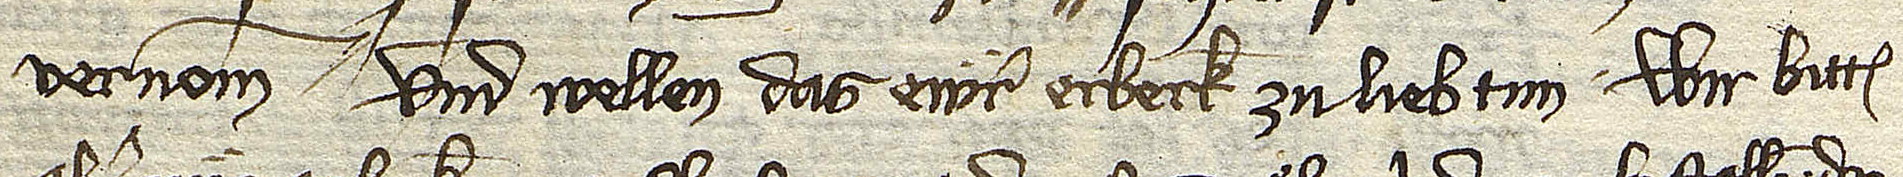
vernom* / Vnd wellen das ew*r erberk* ʒulieb tun . Wir bitt*
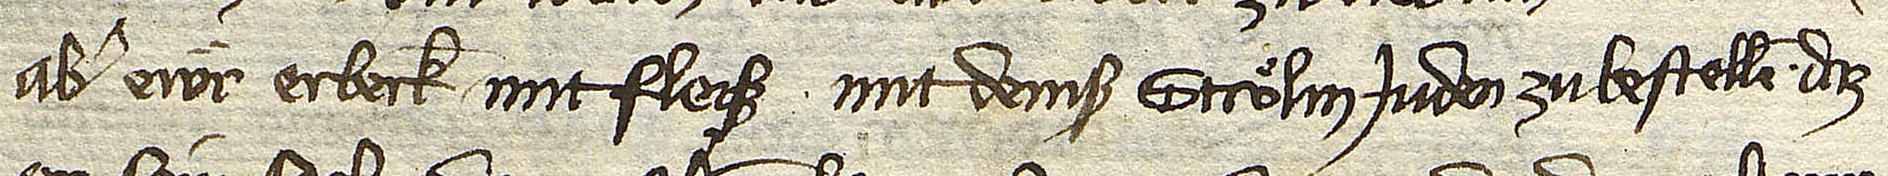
ab* ewr erberk* mit fleiſʒ . mit demſ* Strölin Iuden ʒu beſtelle* . daʒ
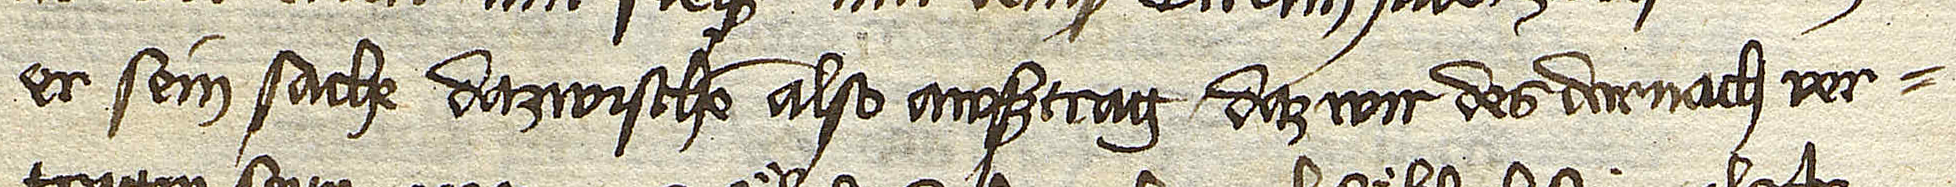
er ſein ſache daʒwiſche* alſo awſʒtrag / daʒ wir des darnach ver =
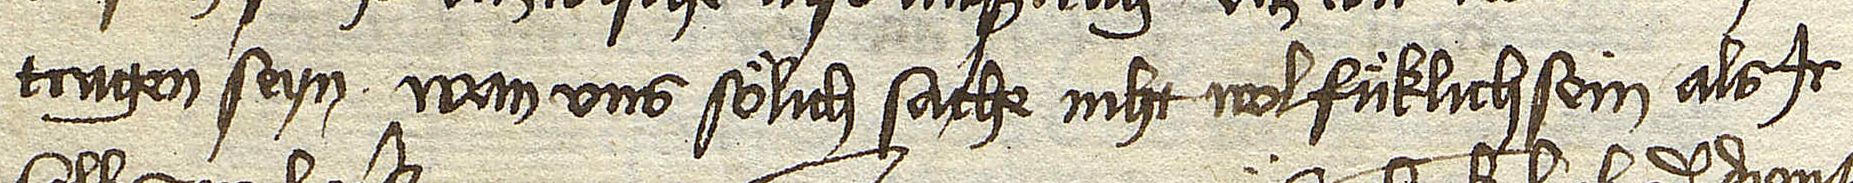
tragen ſeyn . wan vns ſölich ſache niht wol füklich ſein als Ir
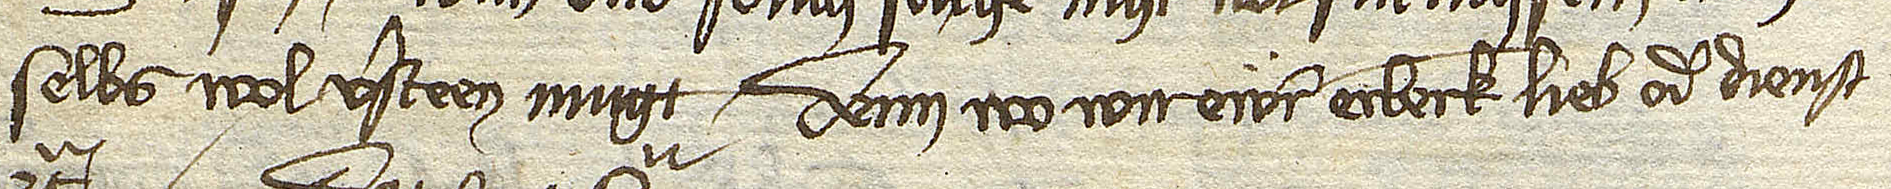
ſelbs wol v*ſteen mugt / Denn wo wir ew*r erberk* lieb od* dienſt
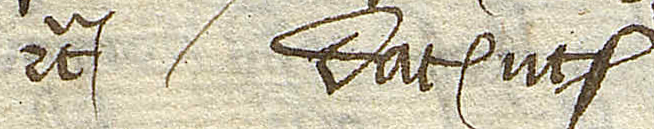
ec* / Dat* ut ſ*
